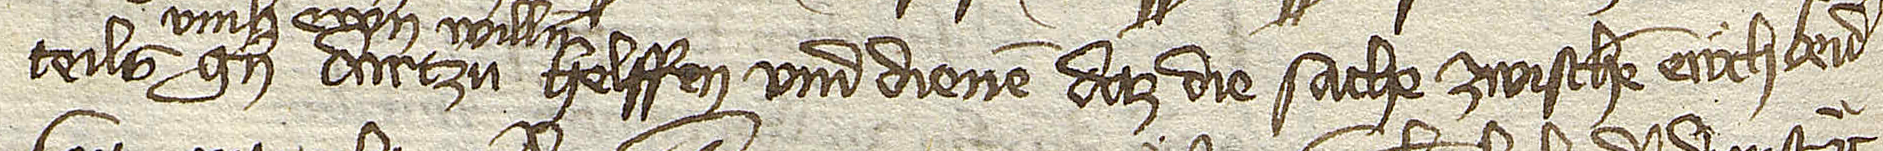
teils g*n darcʒu helffen vnd diene* daʒ die ſache ʒwiſche* eẅch beid*
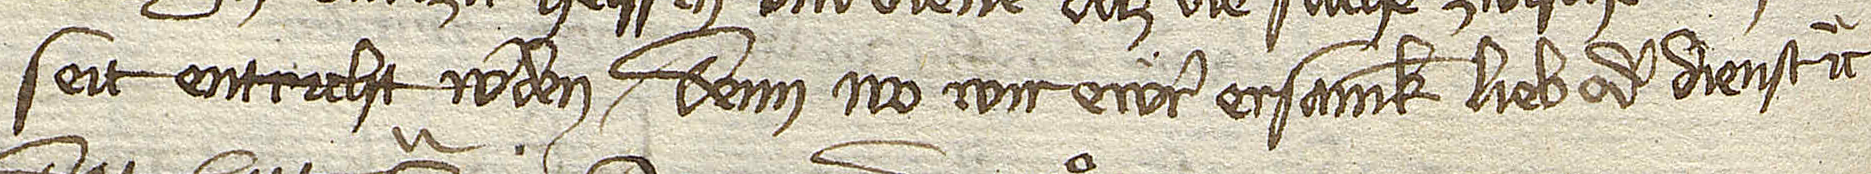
ſeit entricht w*den / Denn wo wir eẅr* erſamk* lieb od* dienſt ec*
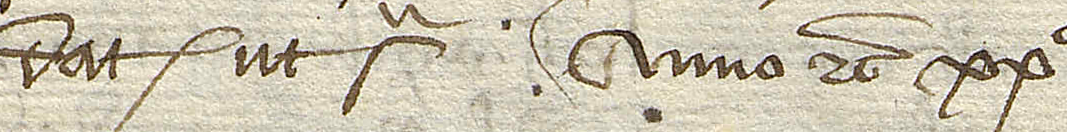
Dat* ut ſ* Anno ec* xx*
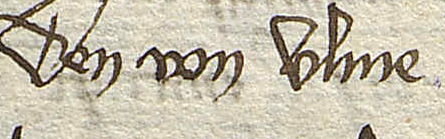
Den von Vlme
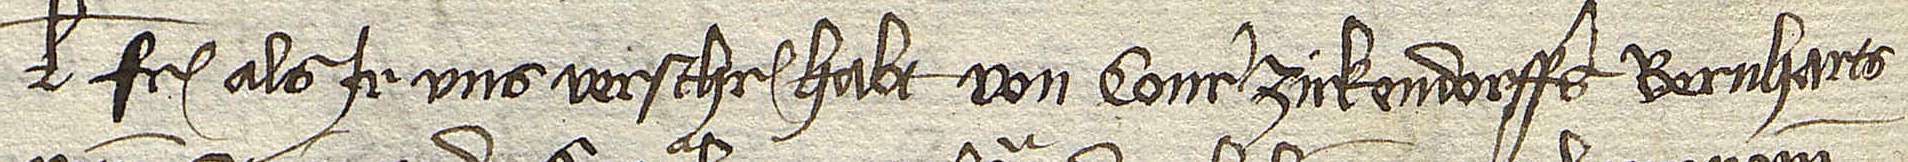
L* fr* als Ir vns verſchr* habt von Conr* Ʒirkendorff*s Bernharts
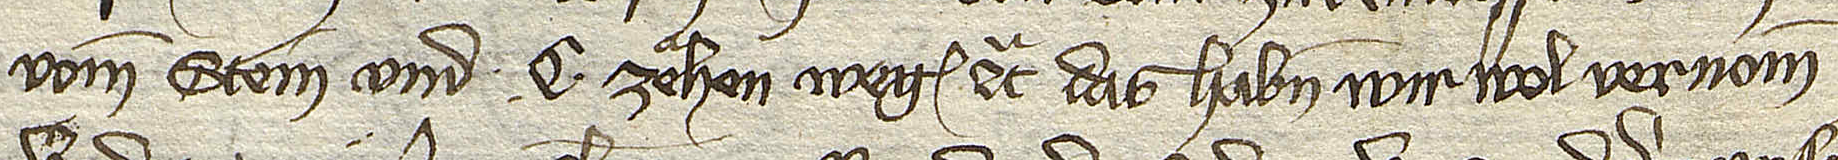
vom* Stein vnd . C . ʒëhen weg* ec* das habn* wir wol vernom*
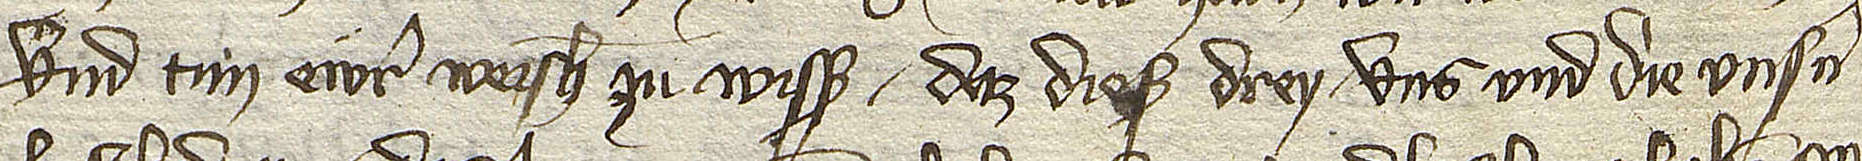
Vnd tun eẅr* weiſh* ʒu wiſſ* / daʒ dieſ* drey / Vns vnd die vnſn*
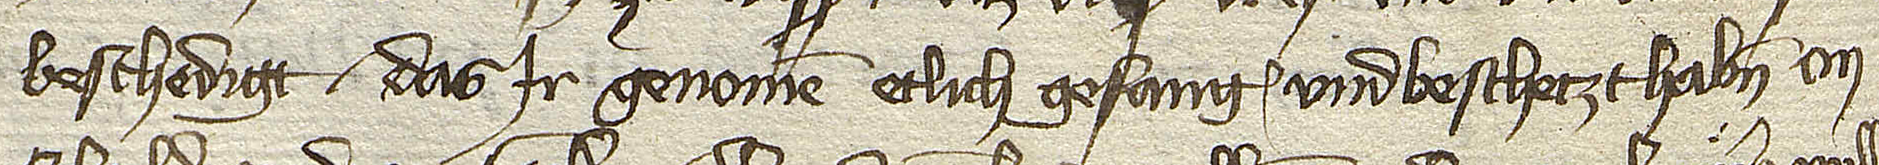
beſchedigt / das Ir genome* etlich gefang* vnd beſchecʒt habn* on
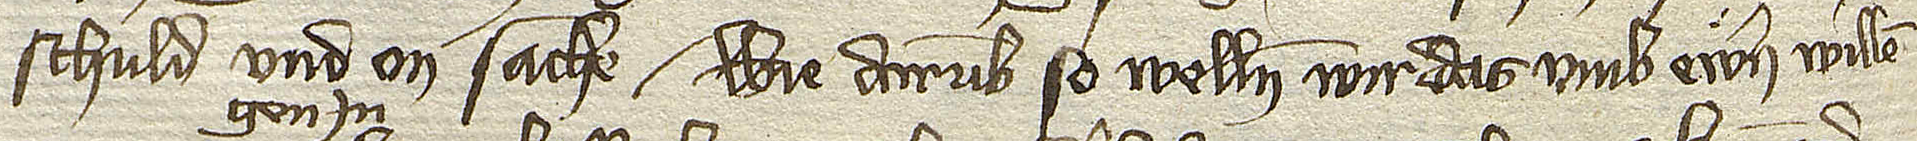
ſchuld vnd on ſache / Wie darub* ſo welln* wir das vmb eẅ*n wille*
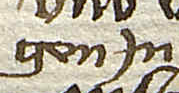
gen In
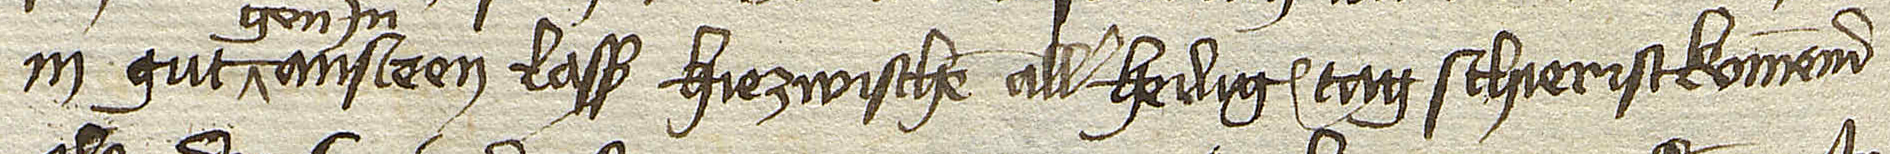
in gut anſteen laſſ* hieʒwiſche* all* heilig* tag ſchieriſt kom*end
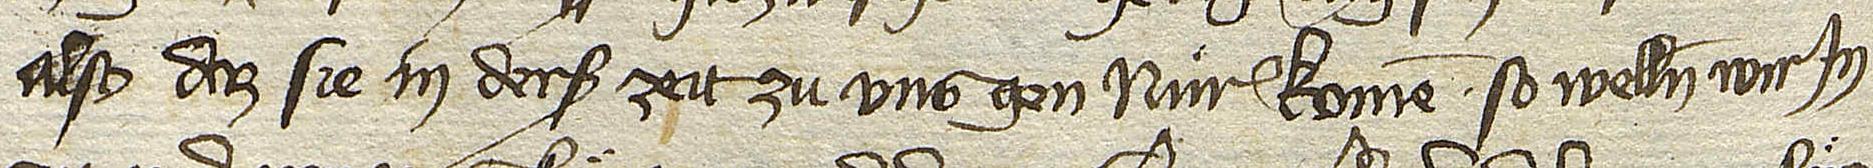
alſo daʒ ſie in derſ* ʒeit ʒu vns gen Nür* kome* / ſo welln* wir In
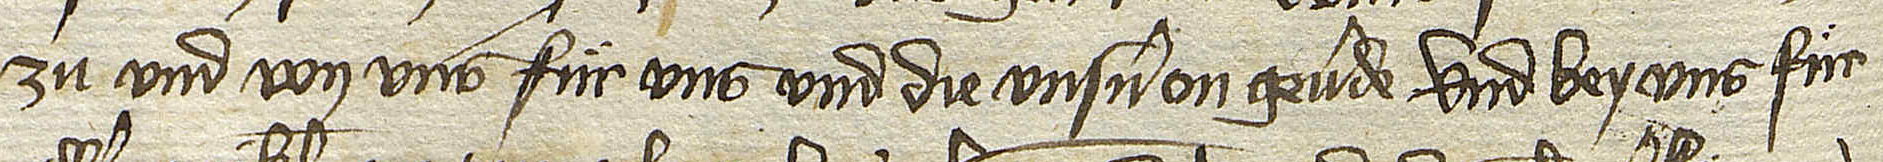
ʒu vnd von vns für vns vnd die vnſn* on geu*de Vnd bey vns für
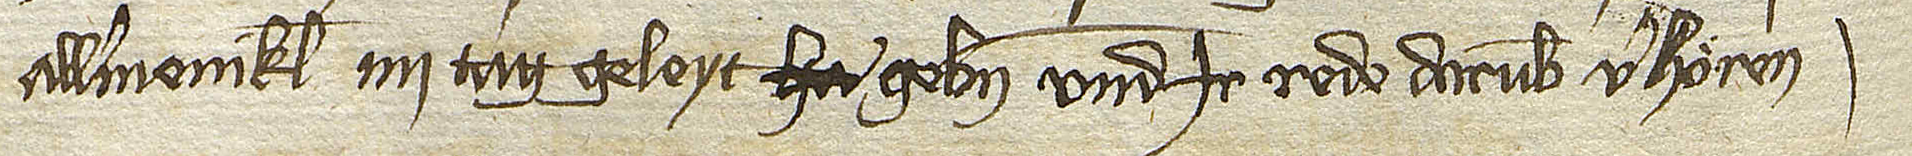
all*menikl* iiii tag geleyt hn* gebn* vnd Ir rede darub* v*hören /
